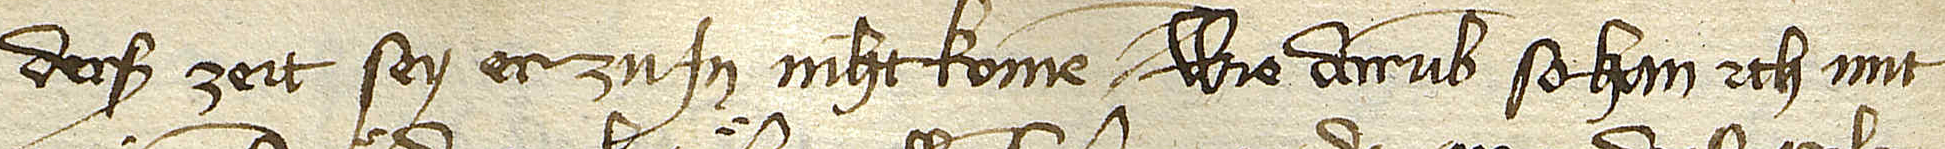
derſ* ʒeit ſey er ʒu In niht kome* . Wie daru*b ſo han ich mit
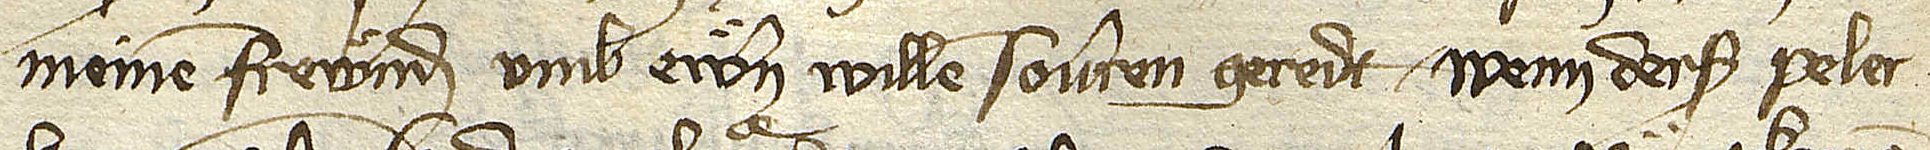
meine* frewnd* vmb ew*n wille* ſou*ren geredt / wenn derſ* peler
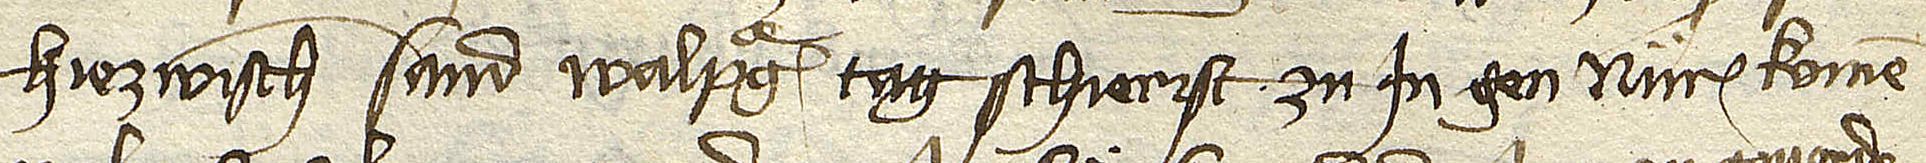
hieʒwiſch* ſand walp*g* tag ſchieriſt . ʒu In gen Nür* kome*
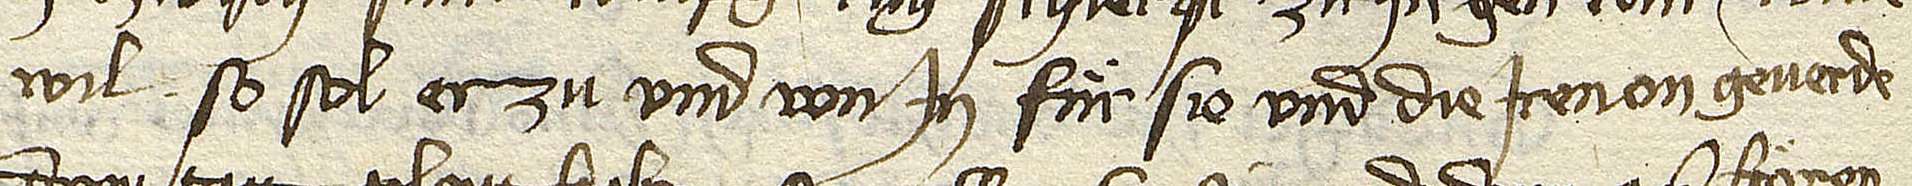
wil . ſo ſol er ʒu vnd von In für ſie vnd die Iren on geuerde
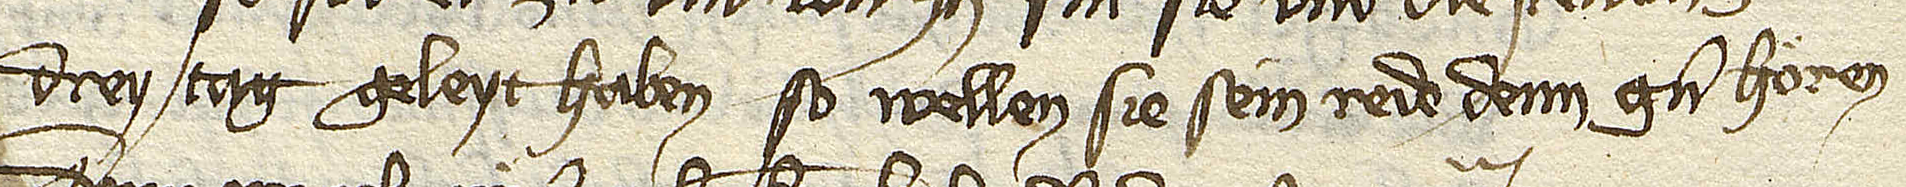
drey tag geleyt haben ſo wellen ſie ſein rede denn g*n hören
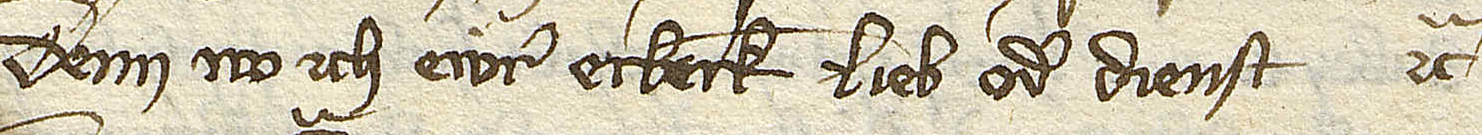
Denn wo ich ew*r erberk* lieb od* dienſt ec*
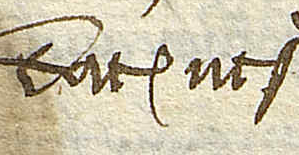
Dat* ut ſ*
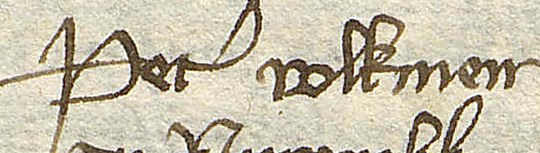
Pet* volkmeir
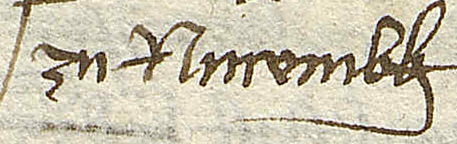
ʒu Nuremb*g
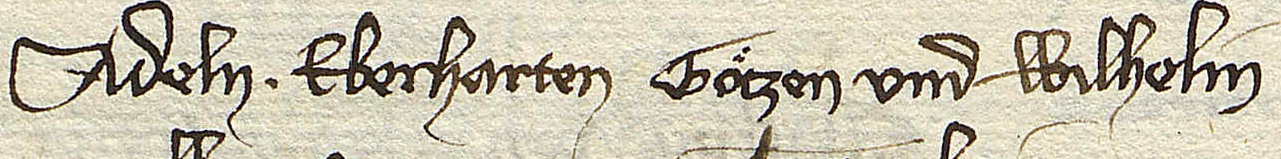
Adeln . Eberharten Göcʒen vnd Wilhelm
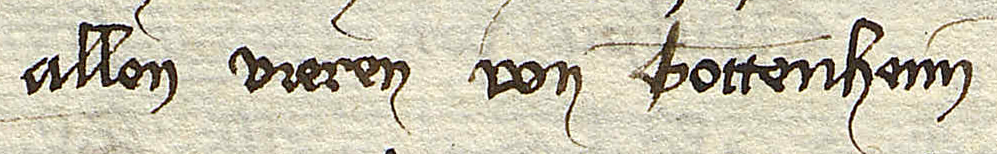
allen vieren von Tottenheim
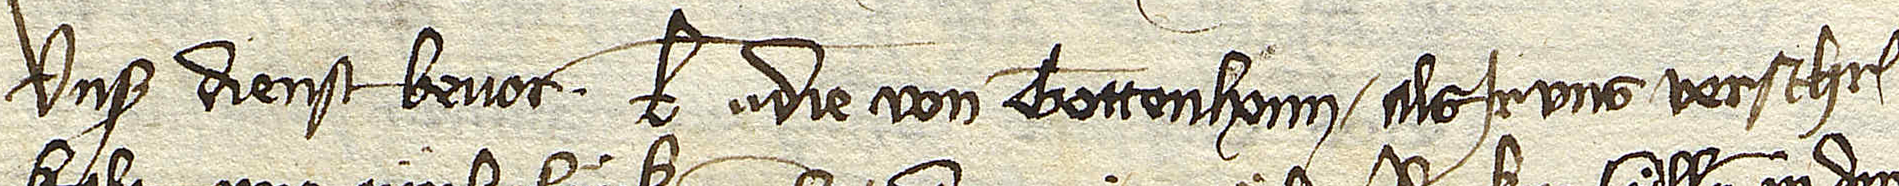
Vnſ* dienſt beuor* . L* ~ die von Tottenheim / als Ir vns verſchr*
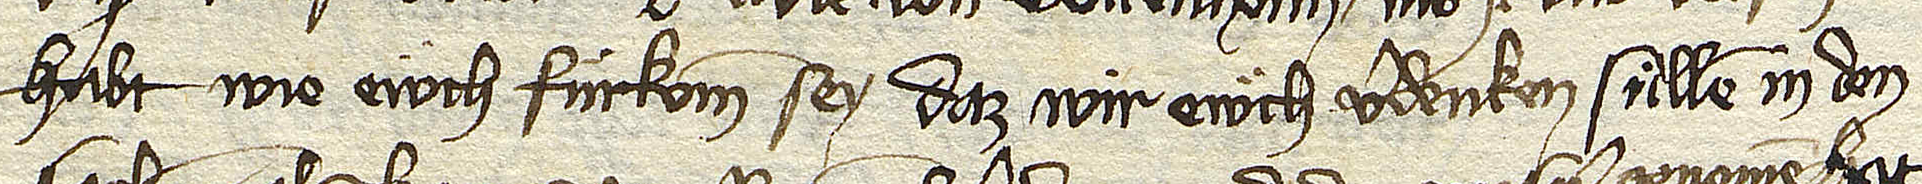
habt wie ewch fürkom* ſey daʒ wir ewch v*denken ſülle* in den
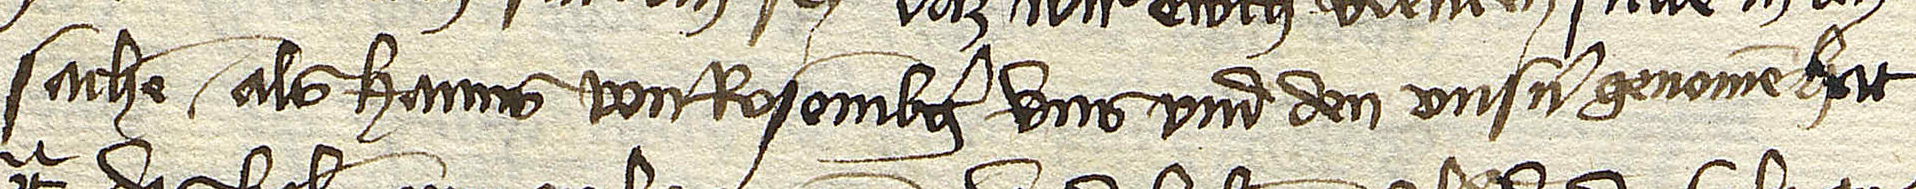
ſache* / als hanns von Roſemb*g Vns vnd den vnſ*n genome* hat
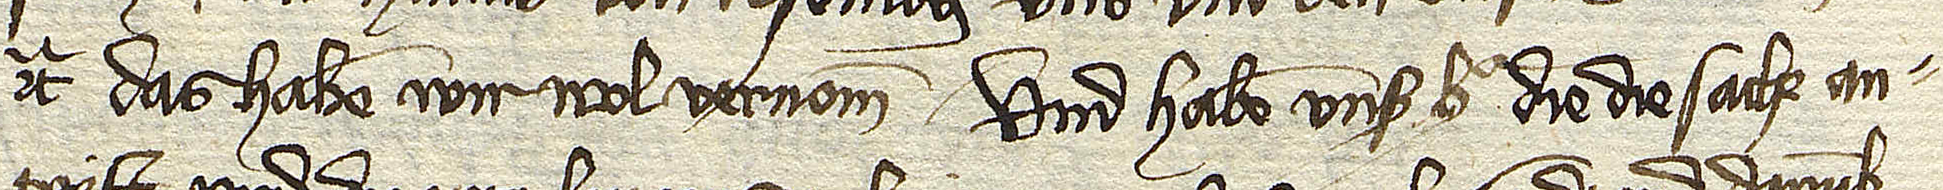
ec* das habe* wir wol vernom* / Vnd habe* vnſ* b* die die ſache an =
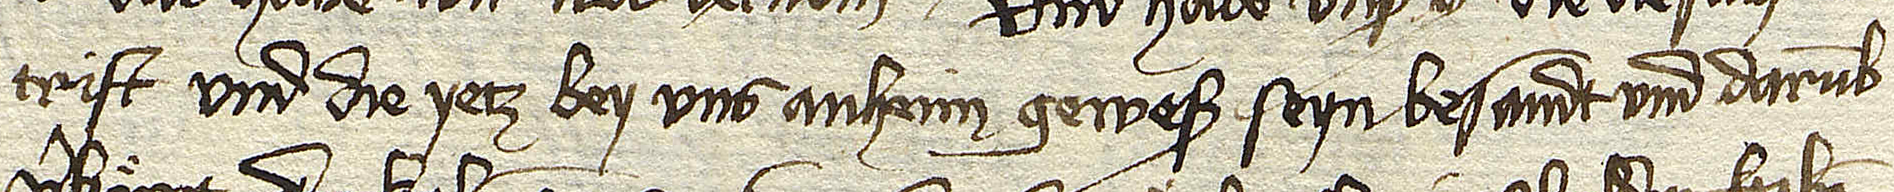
trift vnd die yecʒ bey vns anheim geweſ* ſeyn beſandt vnd daru*b
